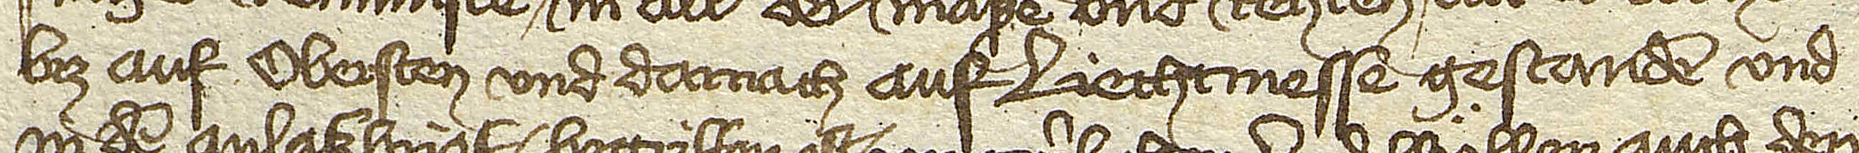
biʒ auf Oberſten vnd darnach auf Liechtmeſſe geſtande* vnd
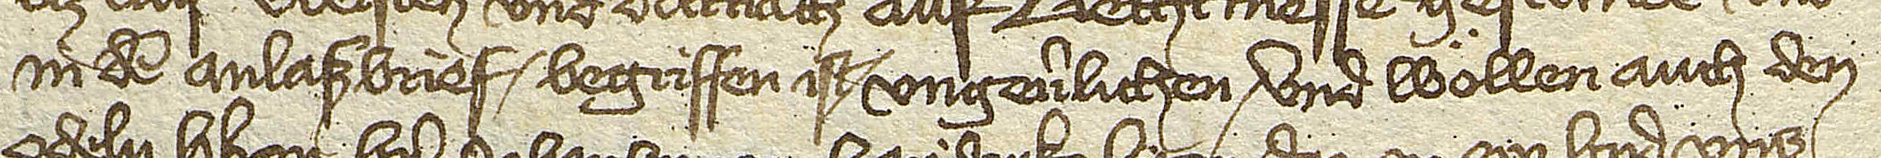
in d* anlaſʒbrief / begriffen iſt / vngeu*lichen / vnd wöllen auch den
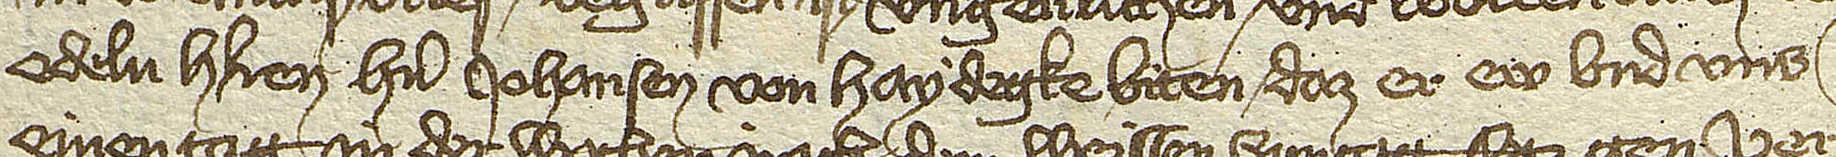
edeln h*ren hn* Iohanſen von haydegke biten / daʒ er ew vnd vns
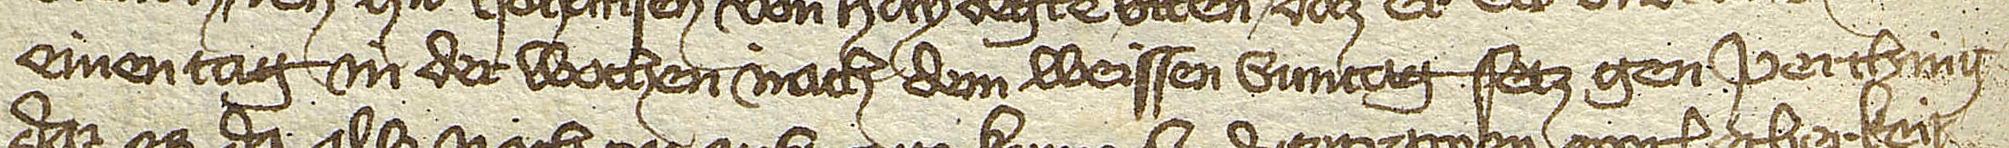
einen tag in der wochen nach dem weiſſen Suntag ſecʒ gen Perching /
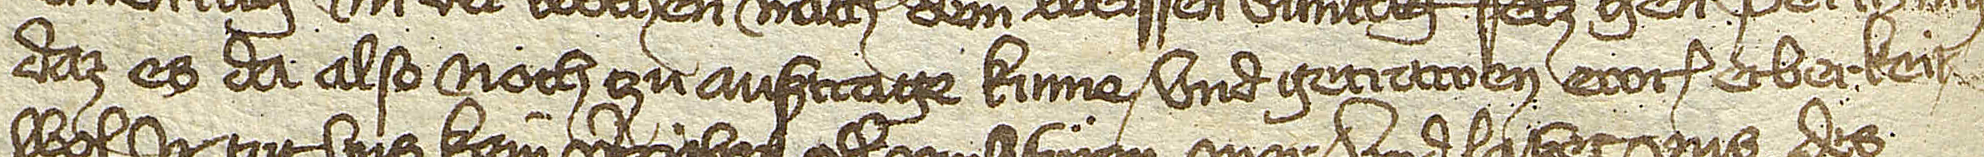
daʒ es da alſo noch cʒu auſʒtrage kume / vnd getrawen ewr* erberkeit
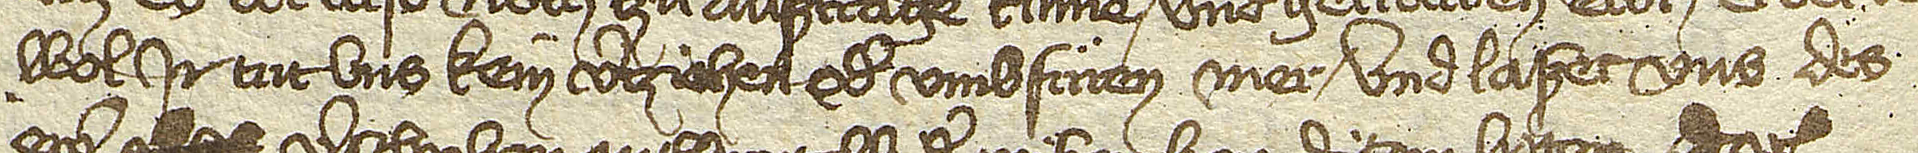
wol Ir tut kein v*cʒiehen od* vmbfüren mer / vnd laſʒet vns des
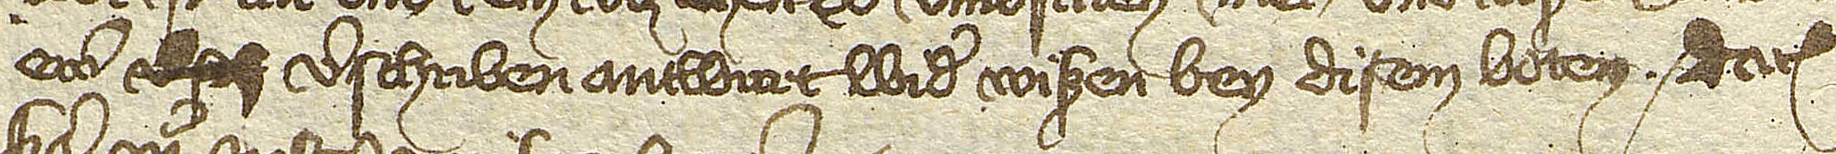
ew* v*ſch v*ſchriben antwurt wid* wiſʒen bey diſem boten . / dar*
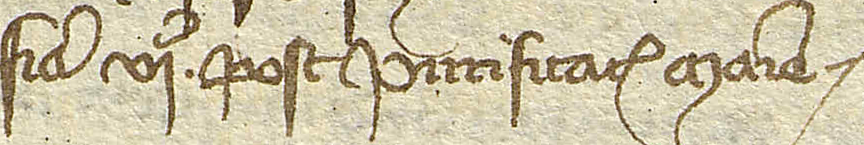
fia* vi* poſt purificac* Maie* - /
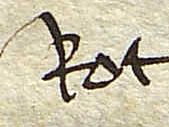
Rot*
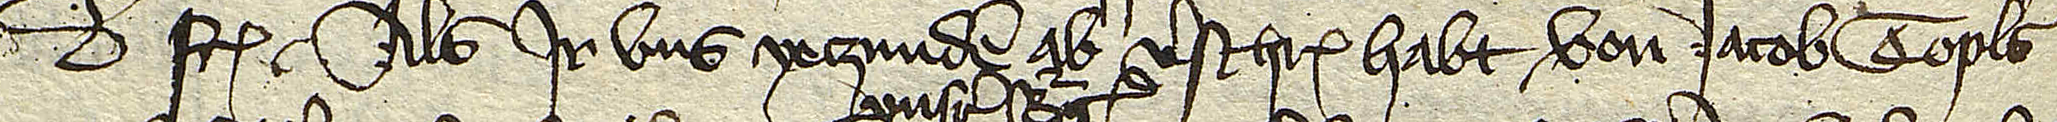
L* fr* / Als Ir vns yecʒunde* ab* v*ſchr* habt / von Iacob Topls*
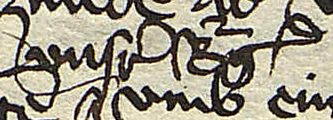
vnſr* B*g*
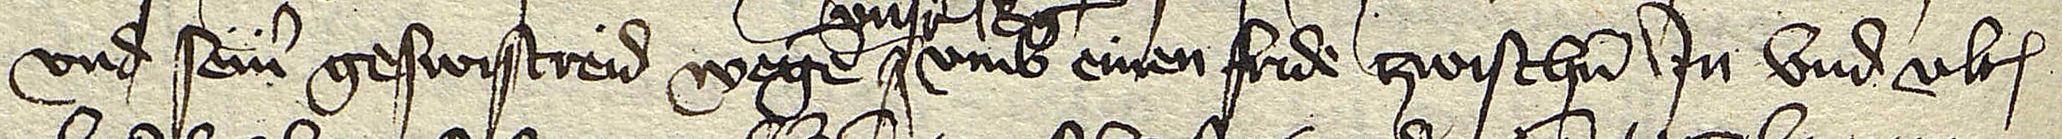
vnd ſein geſwiſtreid wege* vmb eine fride cʒwiſchn* In vnd vlr*
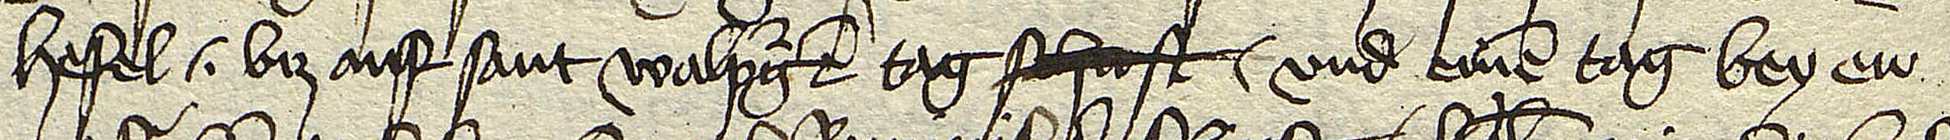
Hefel / . biʒ auf ſant walp*ge* tag ſchirſt / vnd eine* tag bey ew
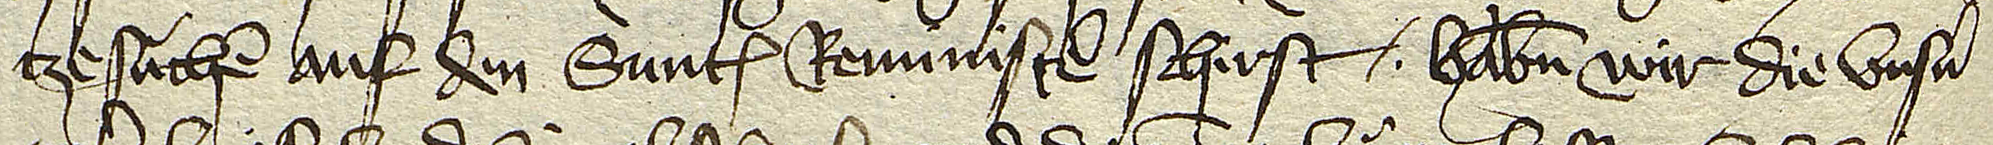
cʒeſüche* auf den Sunt* Reminiſce* ſchirſt / . habn* wir die vnſn*
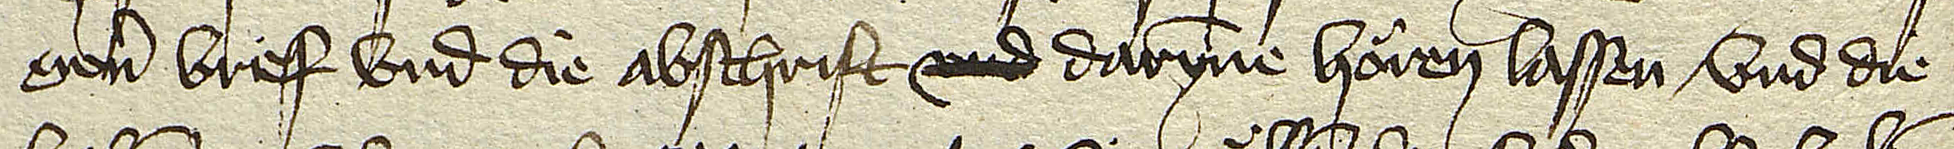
ewn* brief vnd die abſchrift vnd daryne* hören laſſen / vnd die
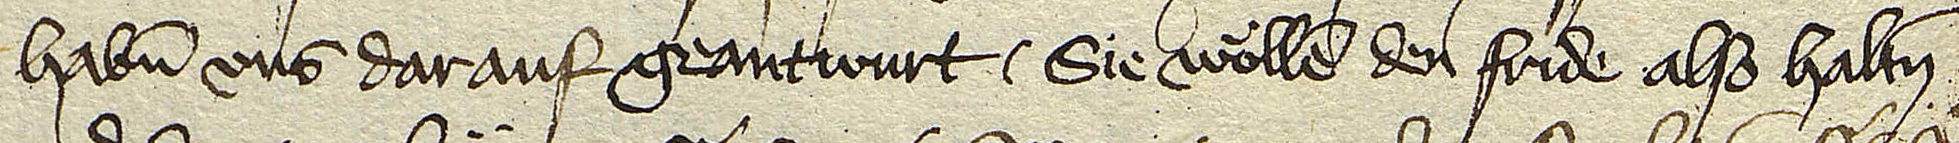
habn* vns darauf geantwurt / Sie wölle* den fride alſo haltn*
